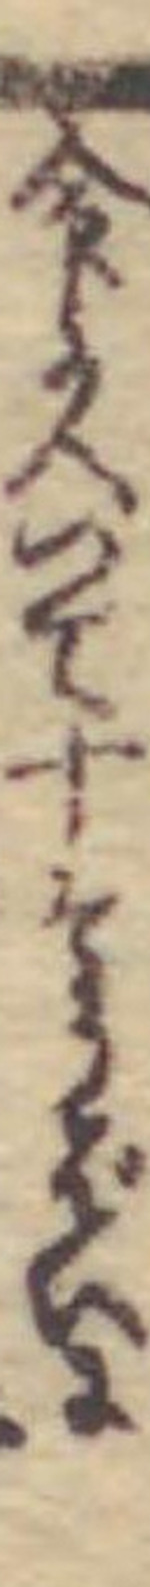命かへつて十そうばいに
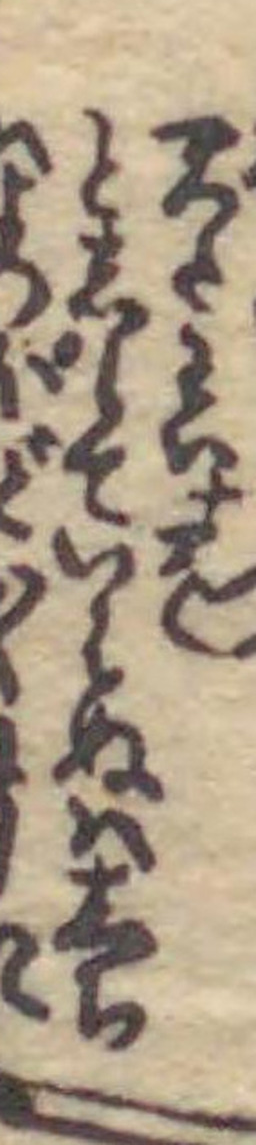とししていはぬはしち
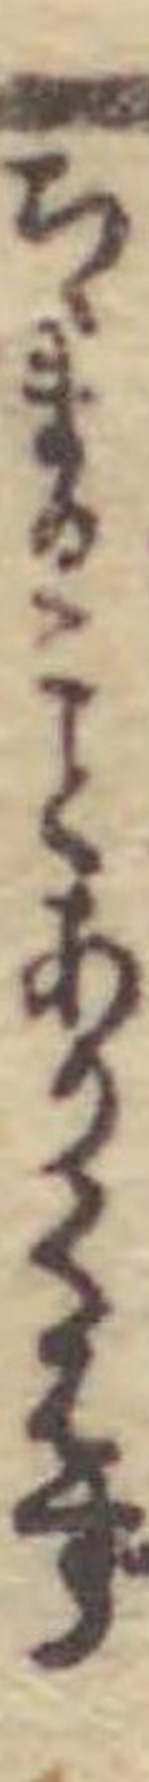ちゝまることありくはず
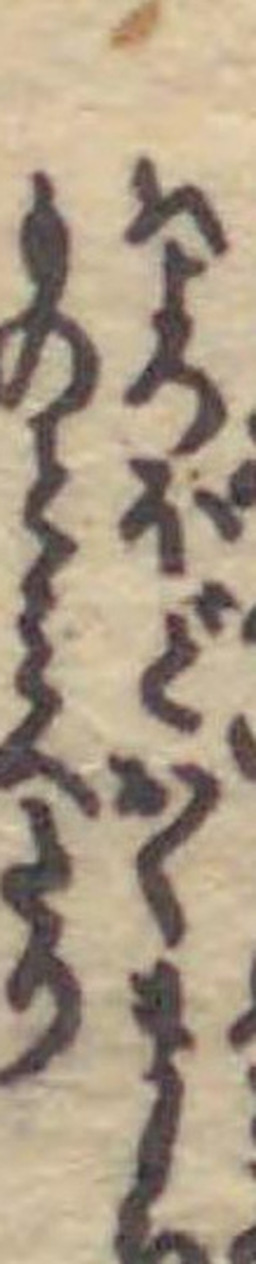ものとみへたり
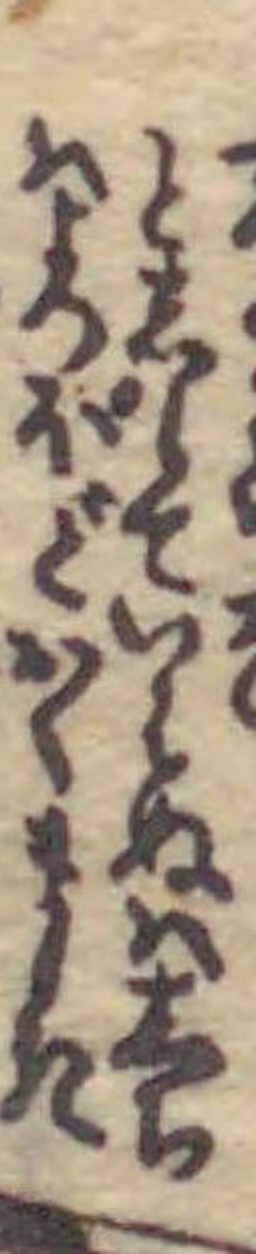はよつぼどおくましき
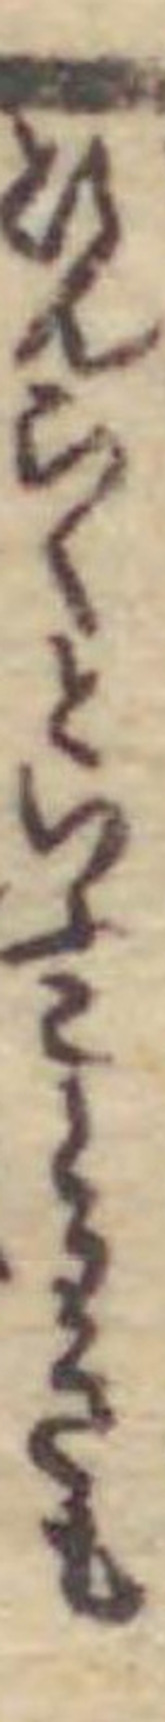ひんらくといふことわさも
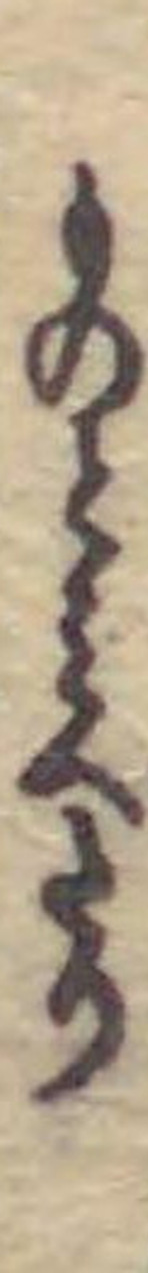ものとみへたり
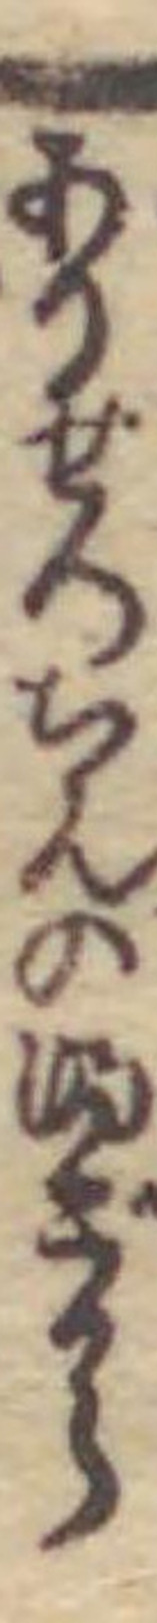ありせつちんの湯ごから
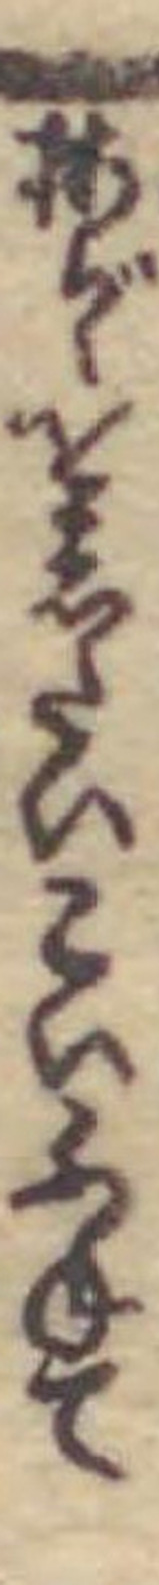梅がゝをしたいこいふねて
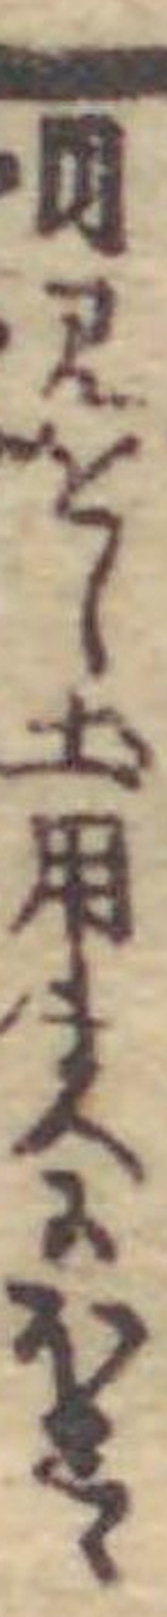月見をし土用まへにほとゝ
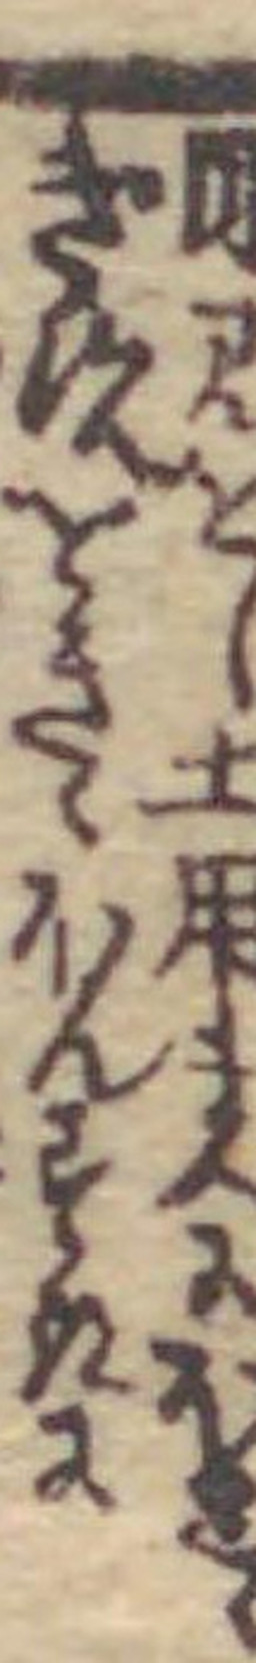ぎすをきくほんすきに
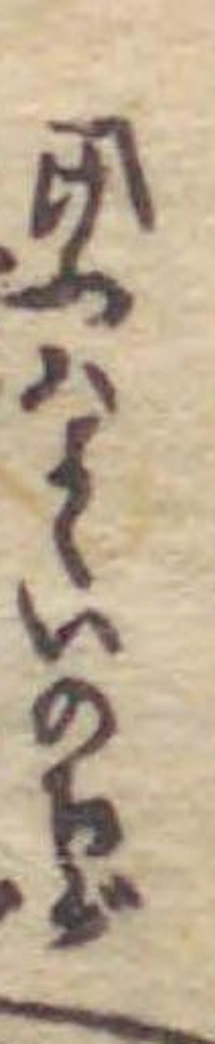〽けふはよくいのちが
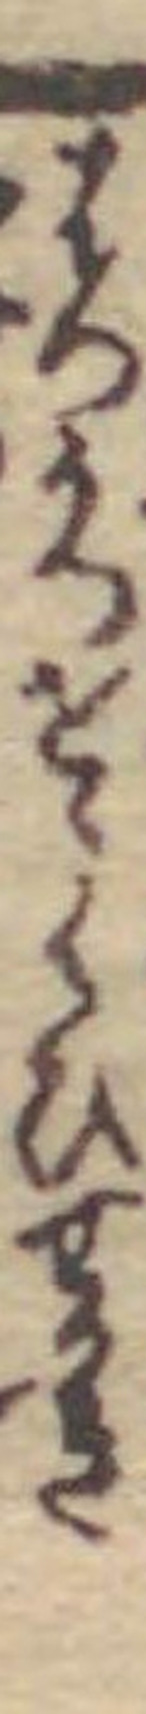はつかつをくはひせかき
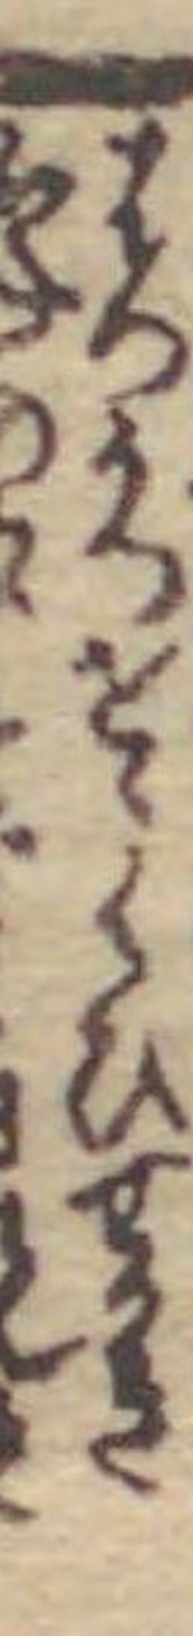はつかつをくはひせかき
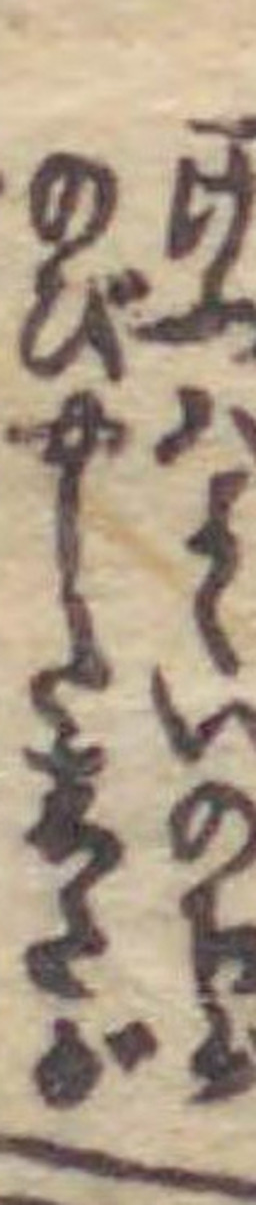のびやしたしたが
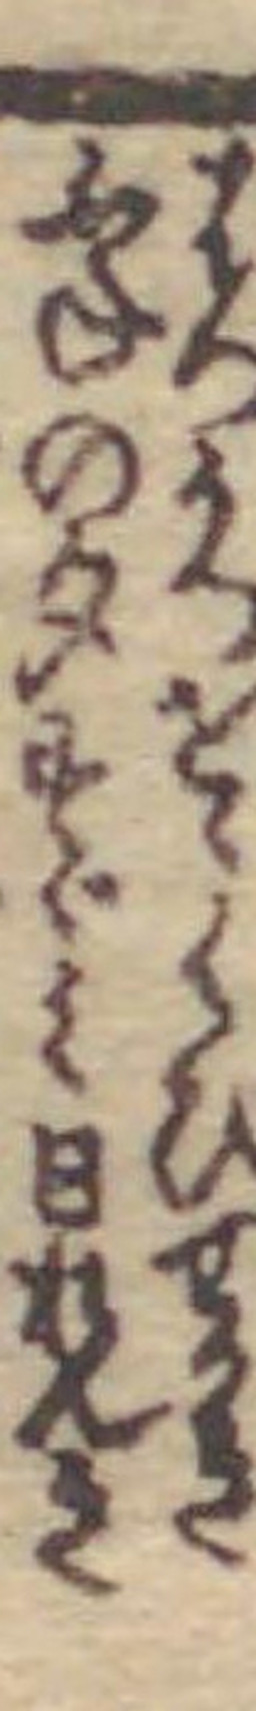ふねの夕すゞみ日れんき
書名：御誂染長寿小紋 : 3巻
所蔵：国立国会図書館 National Diet Library, JAPAN
